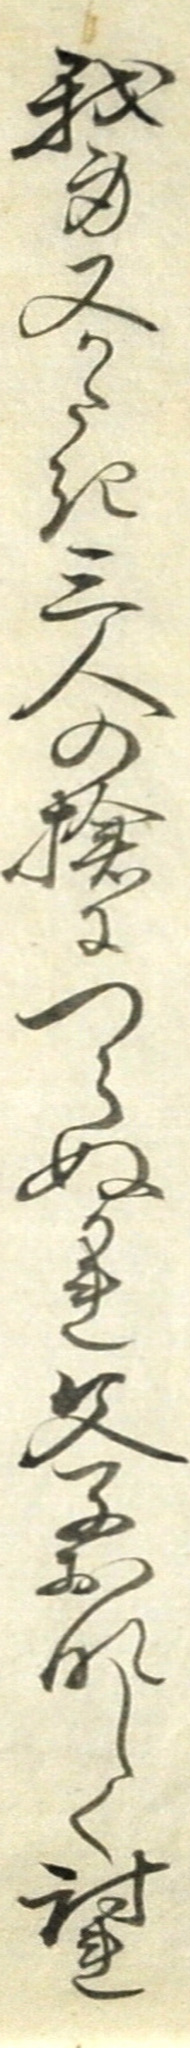我身又かたき三人の槍につらぬかれ父子おなしく討れ
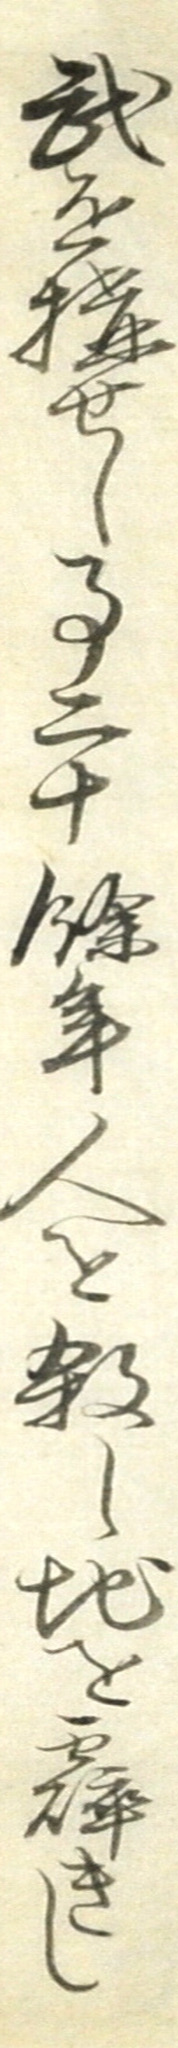武を構せし事二十余年人を殺し地を霹きし
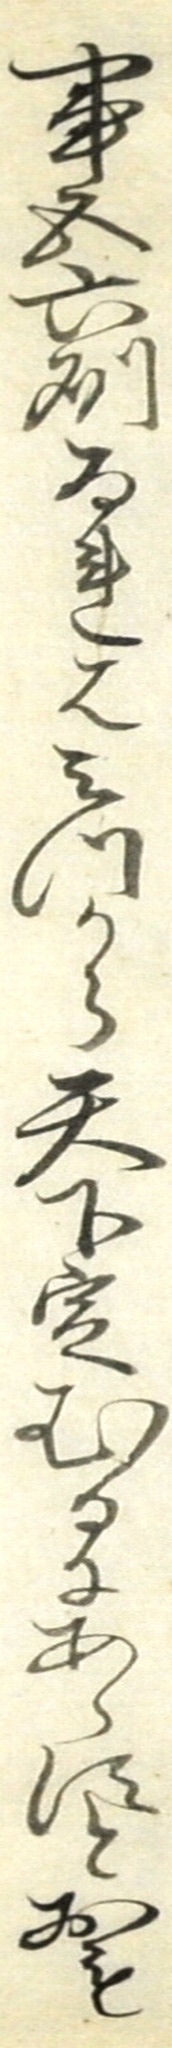事五六州なれはみつから天下定むるにあらすとおも
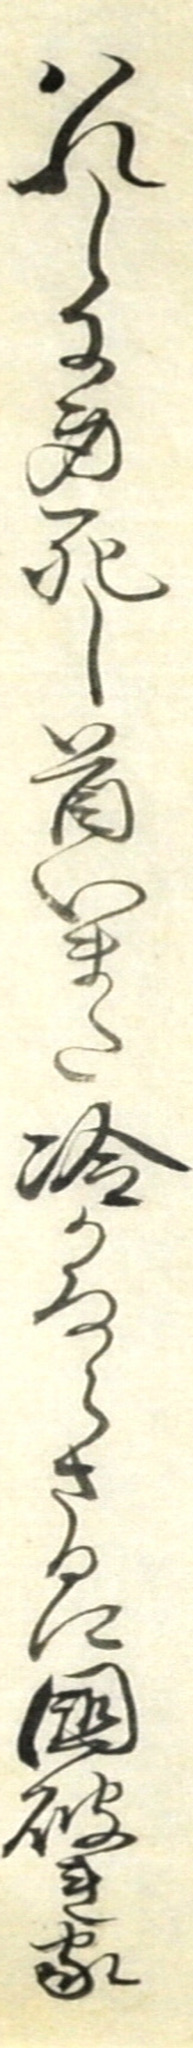はれしに身死し首いまた冷かならさるに国破れ家
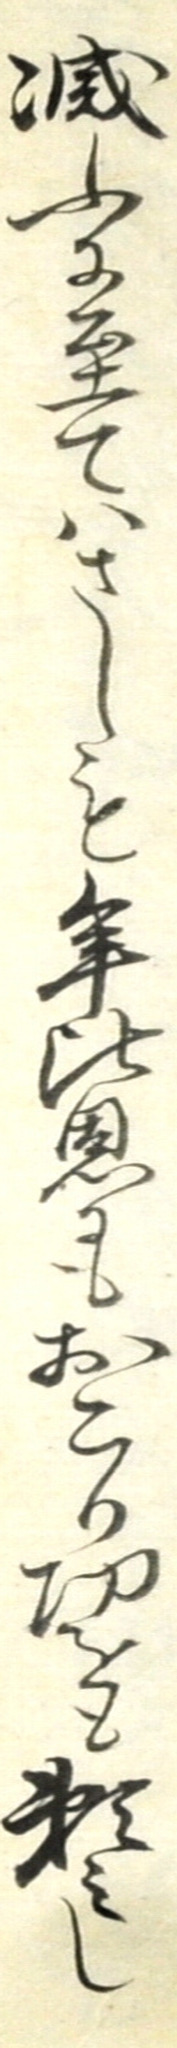滅ふに至てはさしも年比恩にもおこり功をも頼みし
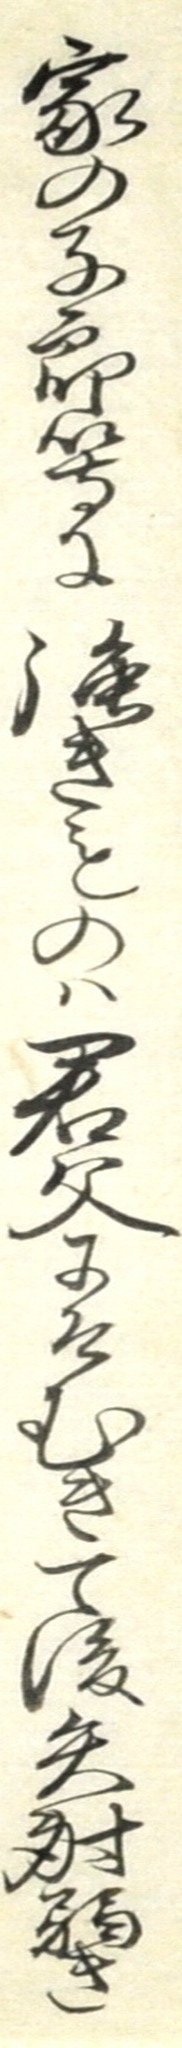家の子郎等に強きものは君父にそむきて後矢射弱き
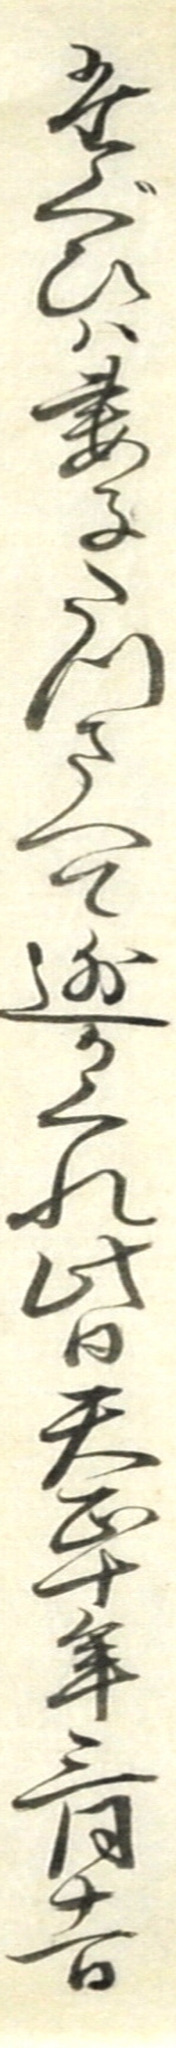たぐひは蔡史妻子たつさへて逃かくれ此日天正十年三月十一日
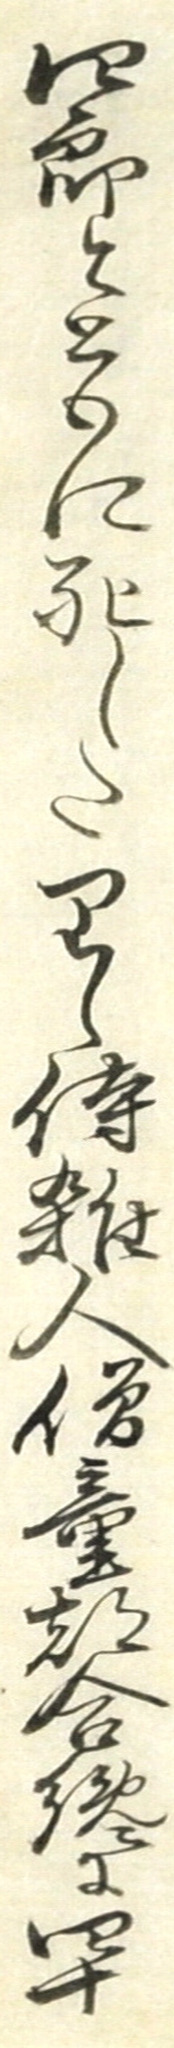四郎とともに死したりし侍雑人僧童都合纔に四十
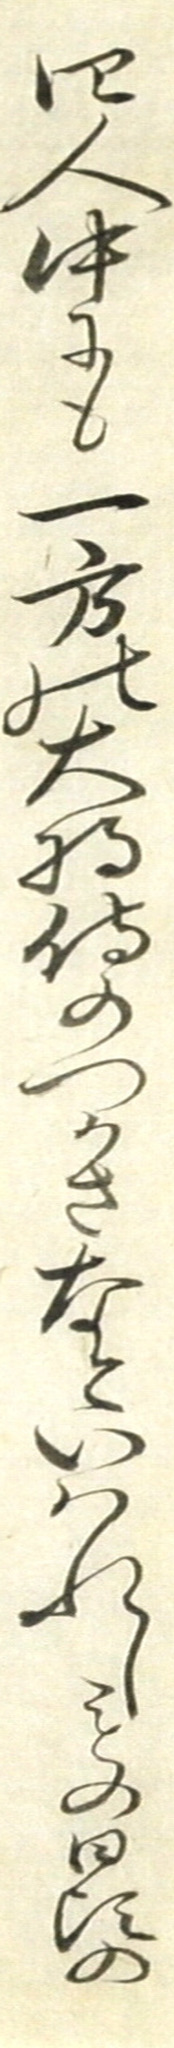四人中にも一方の大将侍のつかさなといはれしもの日頃の
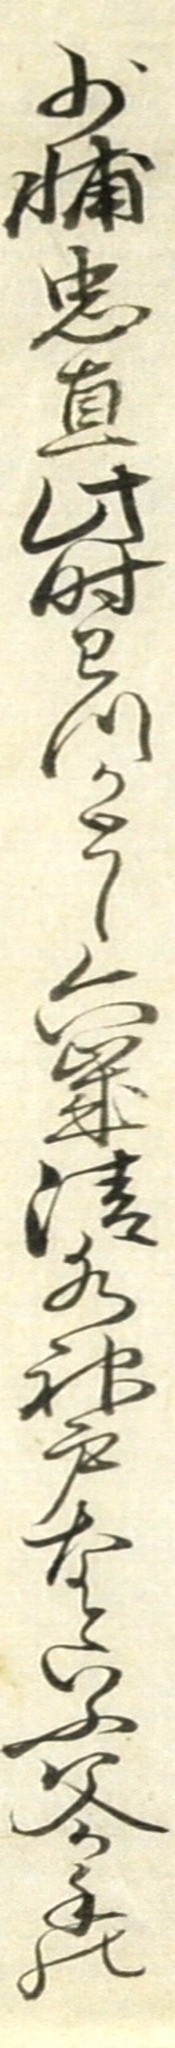少輔忠直此時わつかとし六歳清水神戸なといふ父か手の
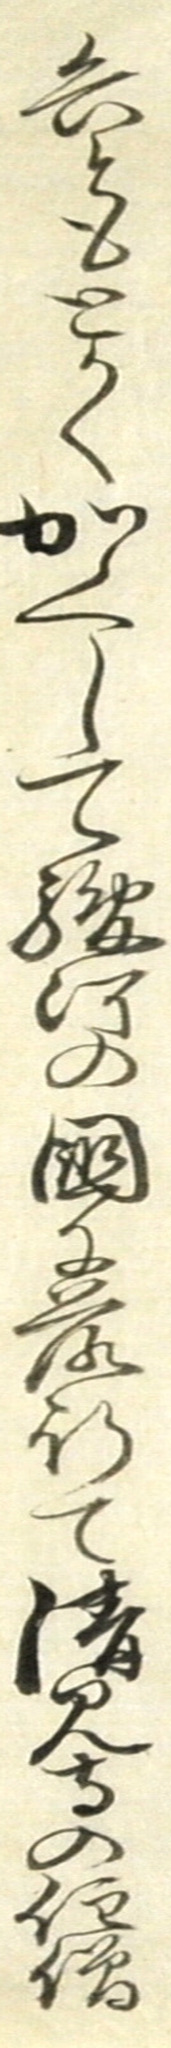兵ともとかくかくして駿河の国に落行て清見寺の住僧
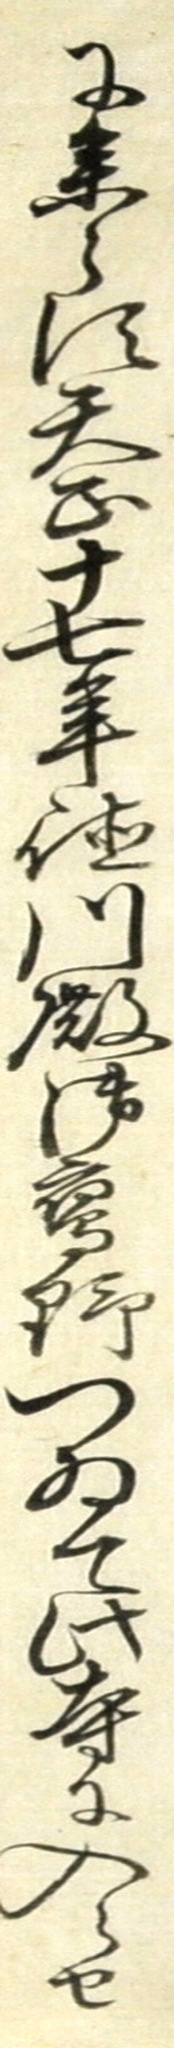に参らす天正十七年徳川殿御鷹野つゐて此寺に入らせ
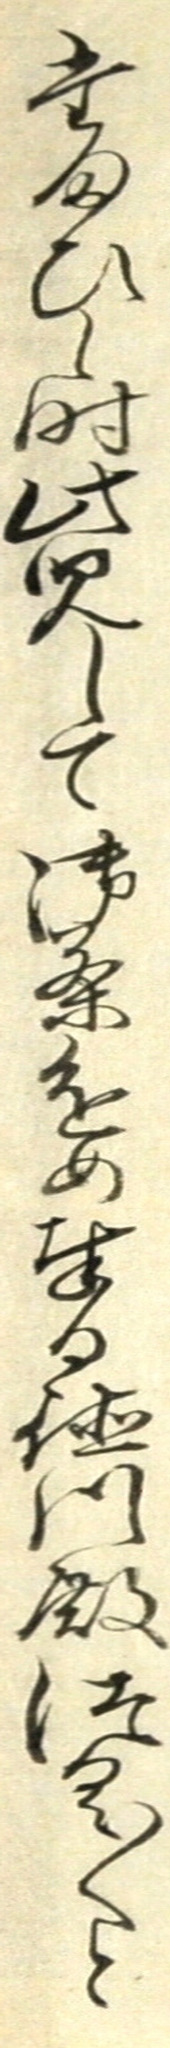たまひし時此児して御条進め奉る徳川殿つく〳〵と

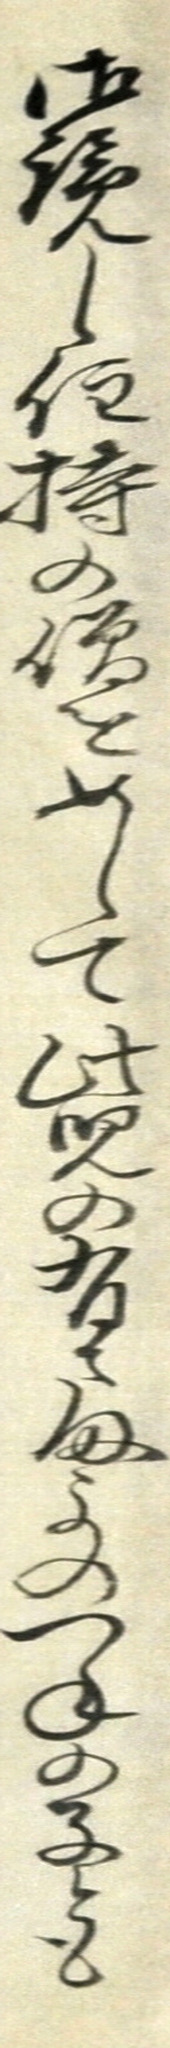御覧し住持の僧をめして此児の有さまよのつねの子とも
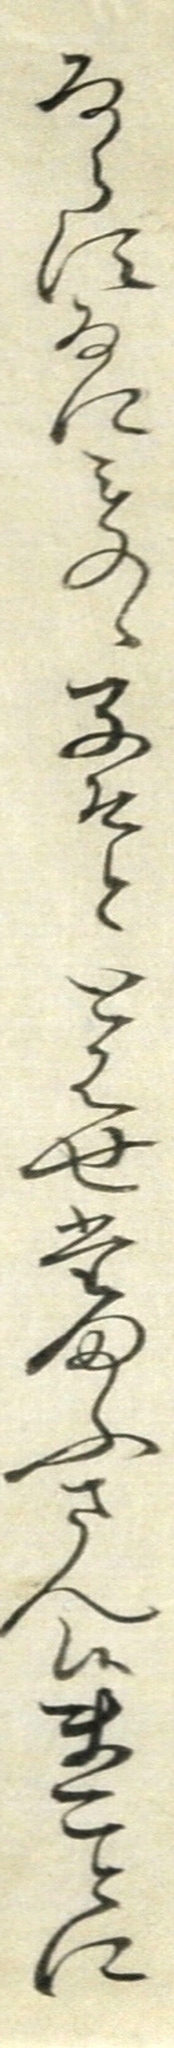ならすなにものゝ子そととはせたまふさん候まことに
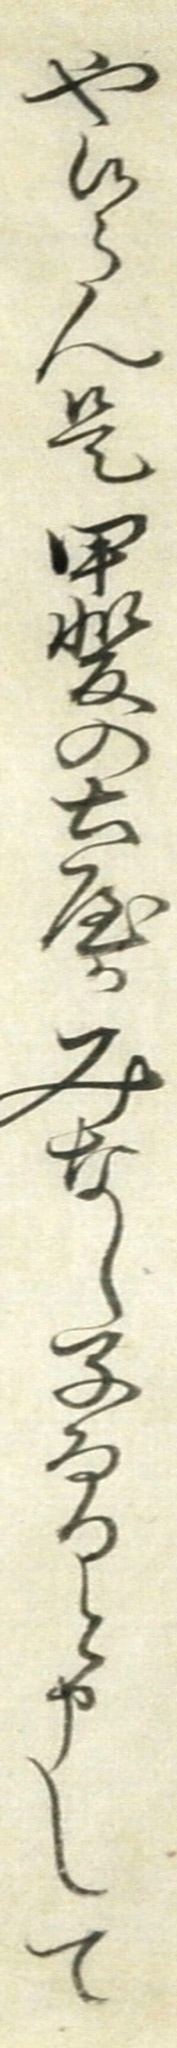や候らん是甲斐の土屋かみなし子なると申して
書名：藩翰譜（六）
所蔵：伊那市立高遠町図書館・合同会社AMANE
